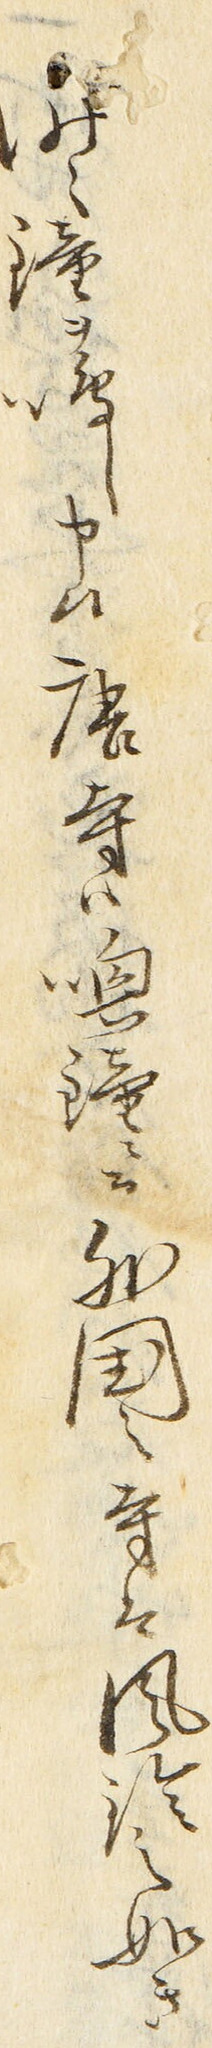時々鐘を鳴し申候唐寺は噢鐘に而外国之寺は風鈴之如き
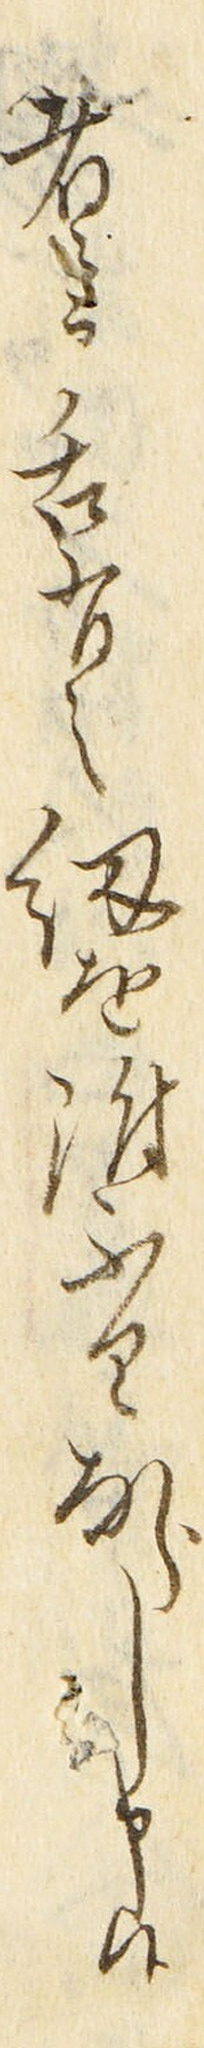者に而舌有之紐を附ふりならし申候

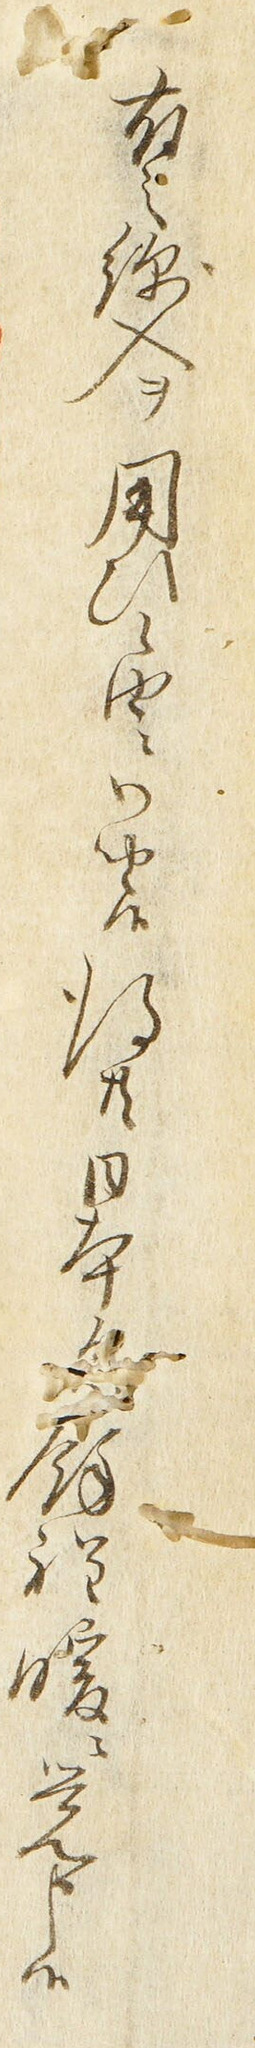有之綿入を用ひ候由に御座候得共日本余程暖に覚申候
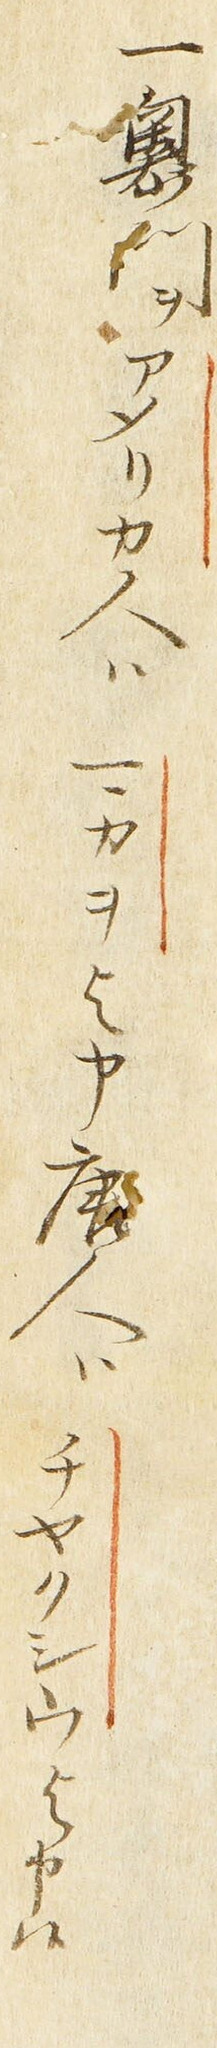一嶴門をアメリカ人はマカヲと申唐人はチヤクシウと申候
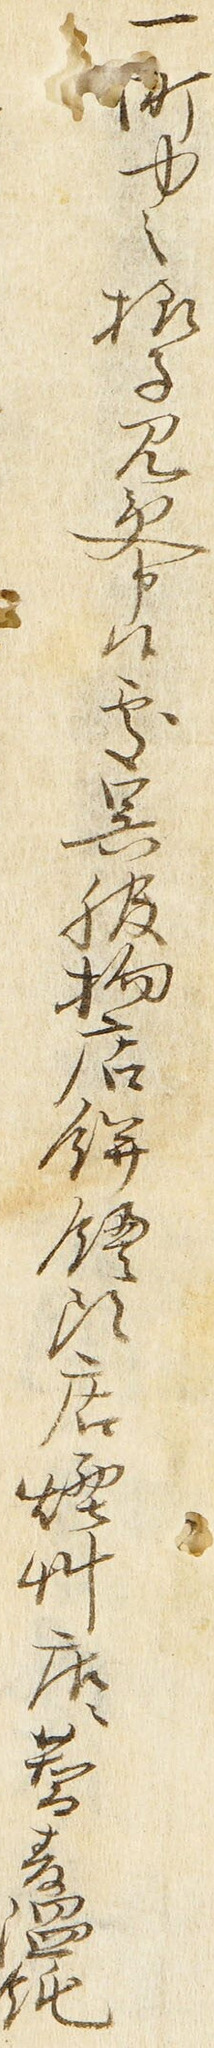一町中之様子見受申候處呉服物店餅饅頭店煙草店に蕎麦温飥
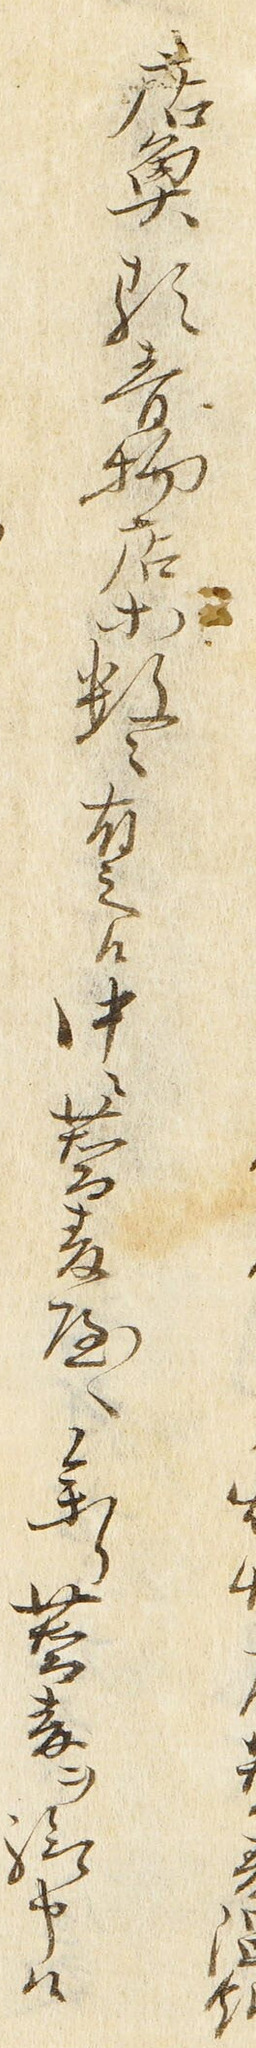店魚類青物店等数々有之候中に蕎麦屋へ参り蕎麦を給申候
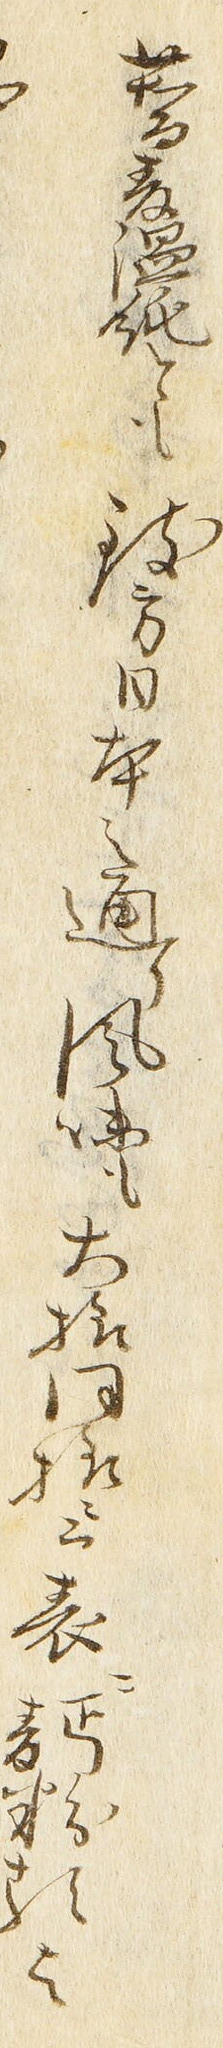蕎麦温飥とも致方日本之通り風味も大様同様に而表に麪粉類と
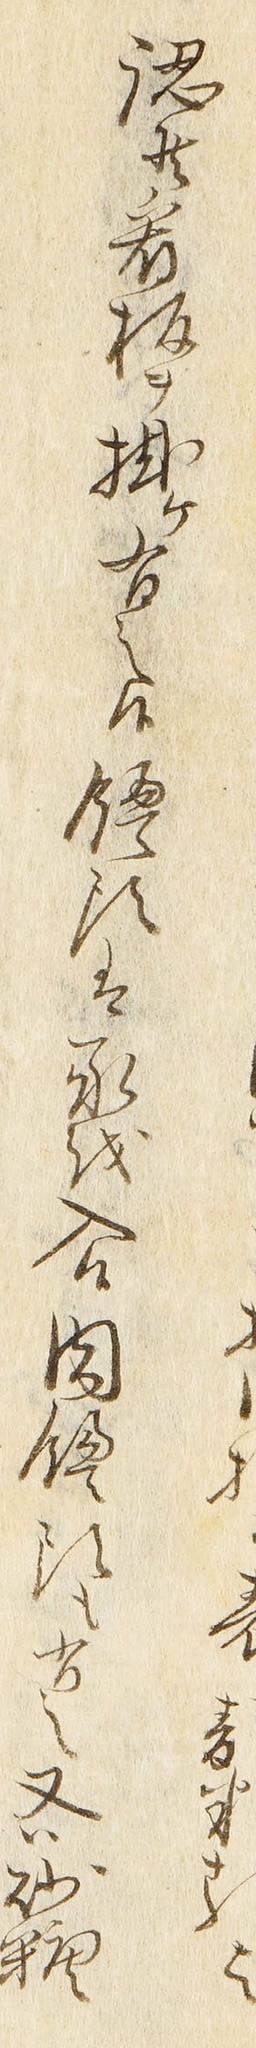認候看板を掛け有之候饅頭は豕を入候肉饅頭も有之又は砂糖
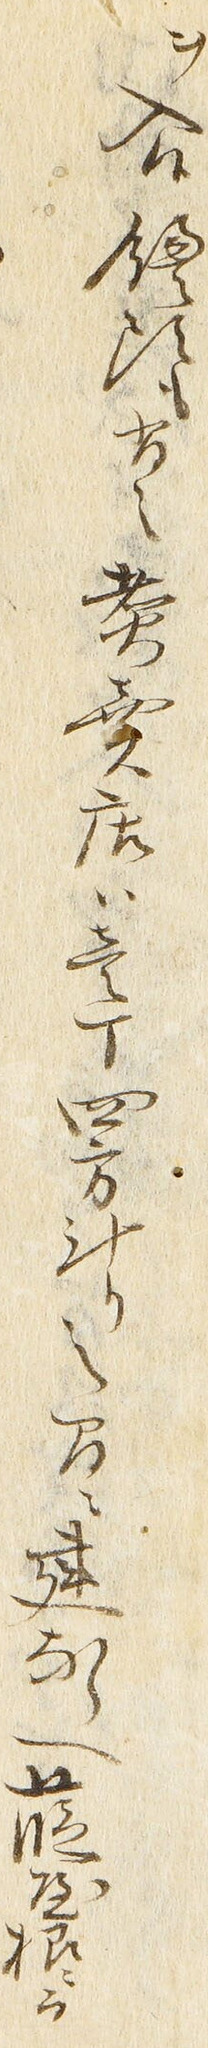を入候饅頭も有之煑売店は壱丁四方斗り之間に建ならへ葭屋根に而
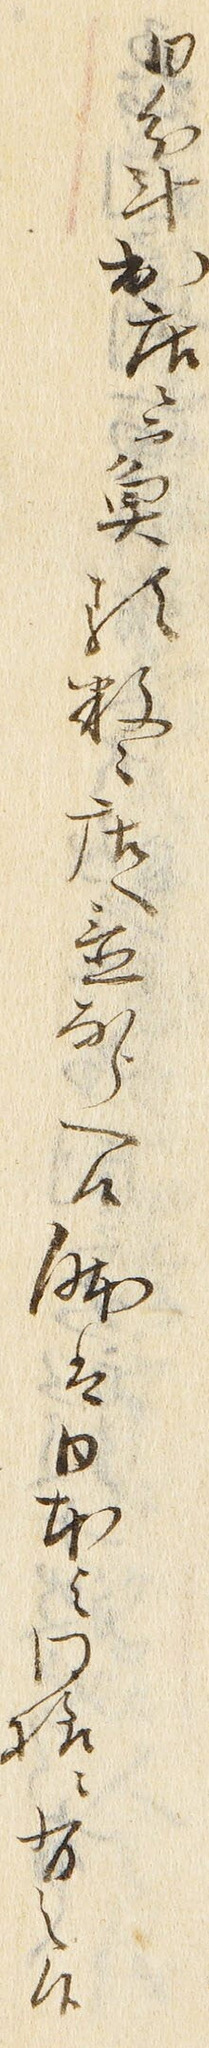日分斗出店に而魚類数々店へ置ならへ候躰は日本と同様に有之候
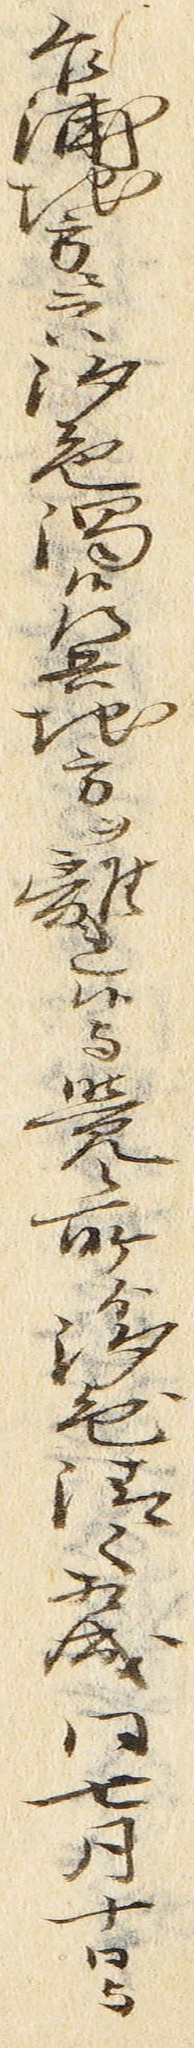乍浦地方に而は汐色濁候得共地方を離れ候と覚候所ゟ汐色清く相成同七月十日と
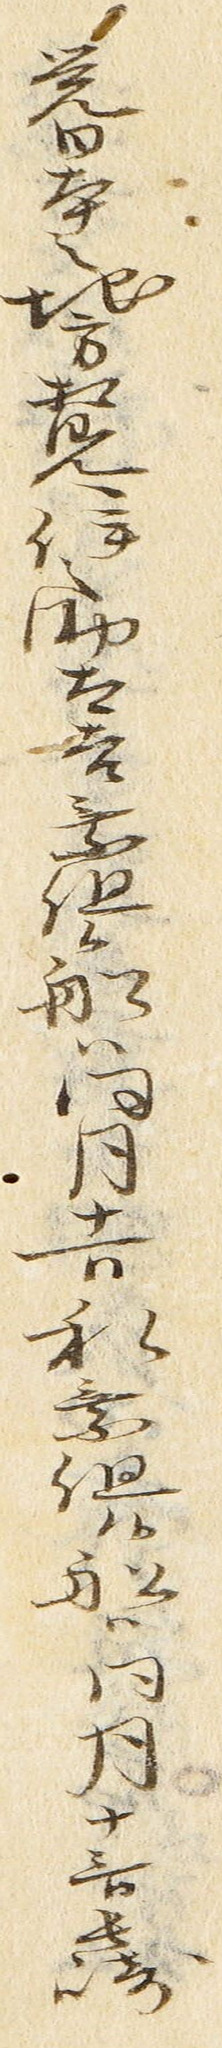覚日本之地方相見へ伊之助太吉乗組か船は同月十一日私乗組候船は同月十三日長崎
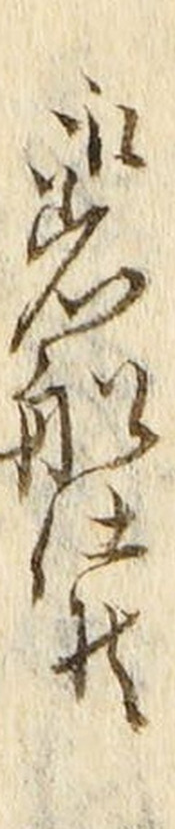江着船仕候
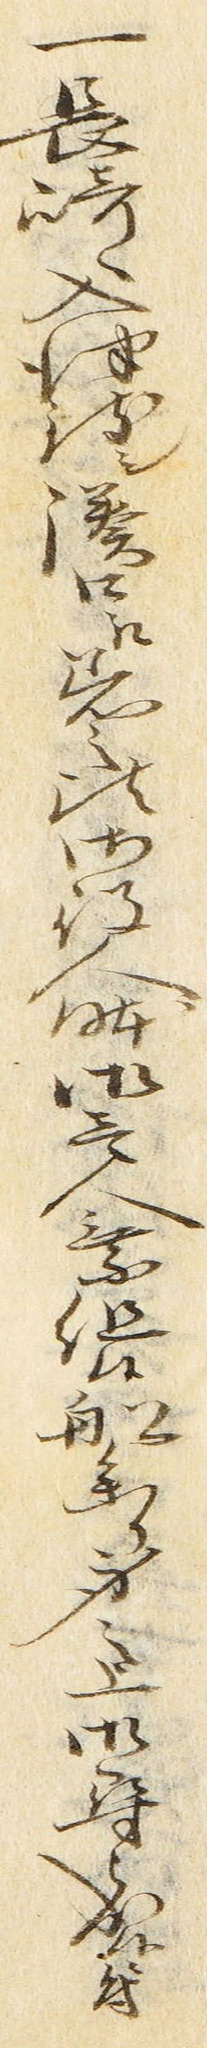一長崎へ入津致し湊口江着之所御役人躰御壱人乗組候船参り身之上御尋被成候に付
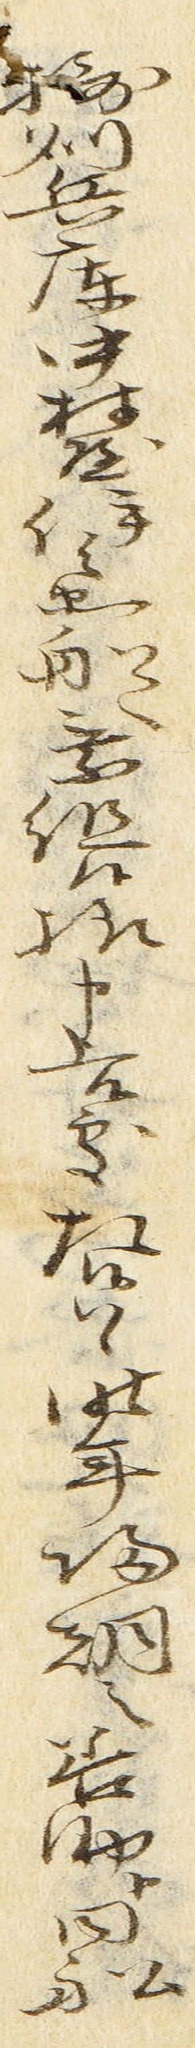摂州兵庫中村屋伊兵衛船へ乗組候様申上候處相候はゝ昨年帰朝之善助と同船
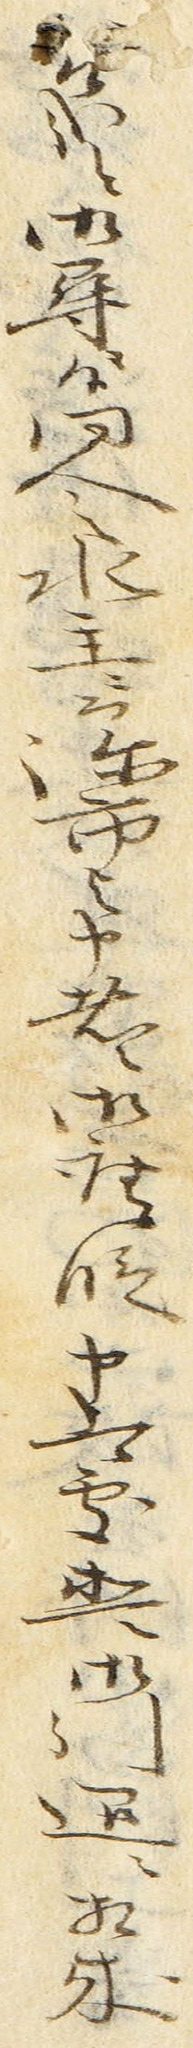候哉と御尋に候同人之水主に而弥市と申者に御座候段申上候處直に御引退に相来
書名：漂流人弥市之記
